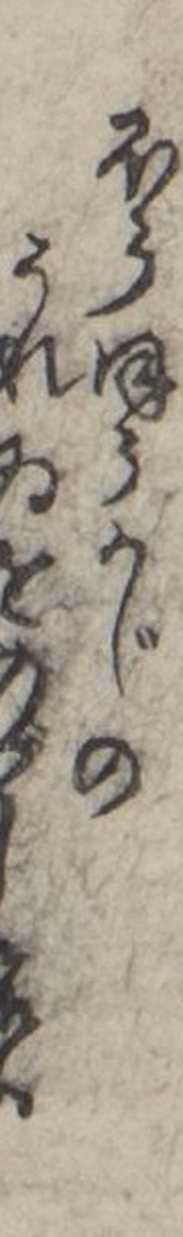ほうほうかじの
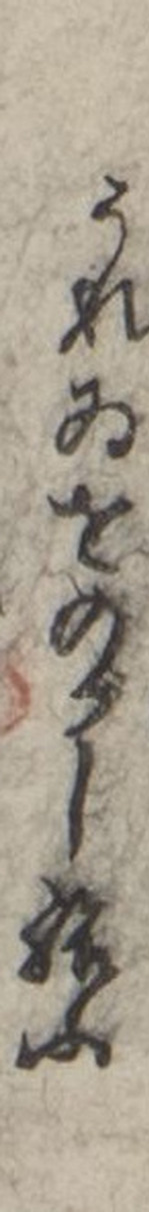うれゐをのかし給ふ
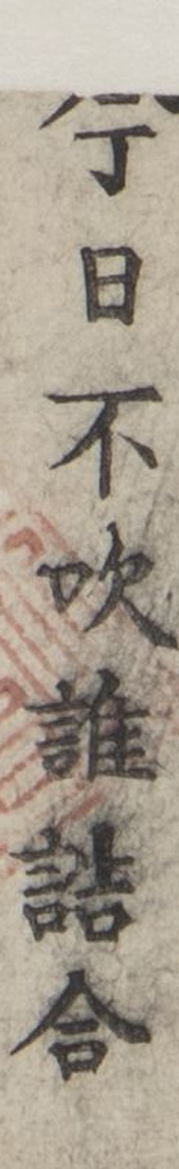今日不吹誰詰合
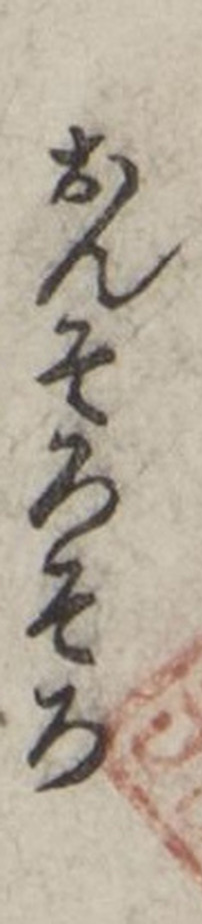おんそろそろ
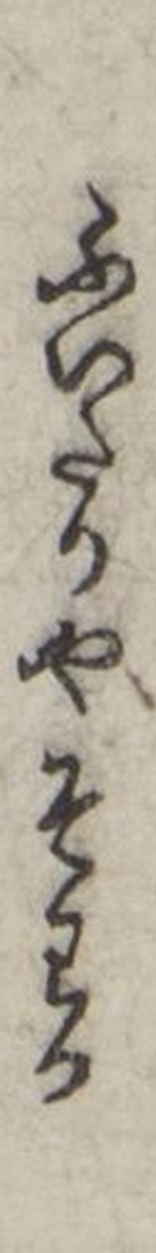ふいたりやそわか
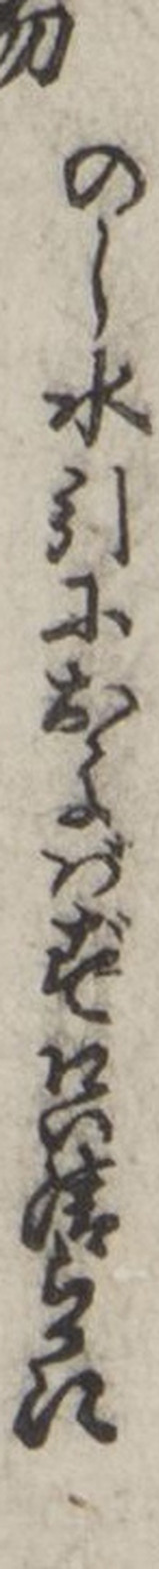供物のし水引におよばず只清らかに
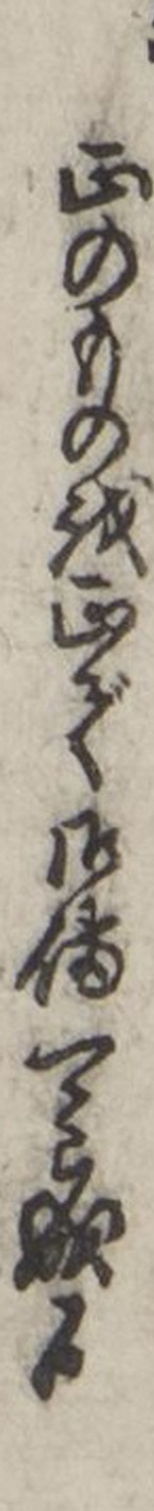正のものを正で御備可被成候
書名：守礼　大矢山日行寺
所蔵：あいおいニッセイ同和損保株式会社
